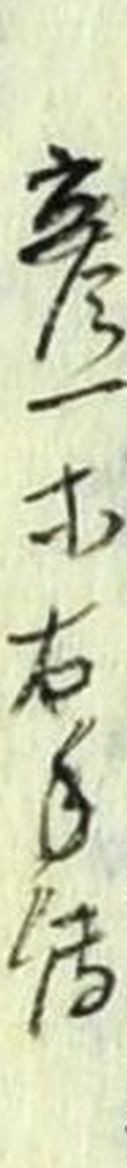彦一等右手伝
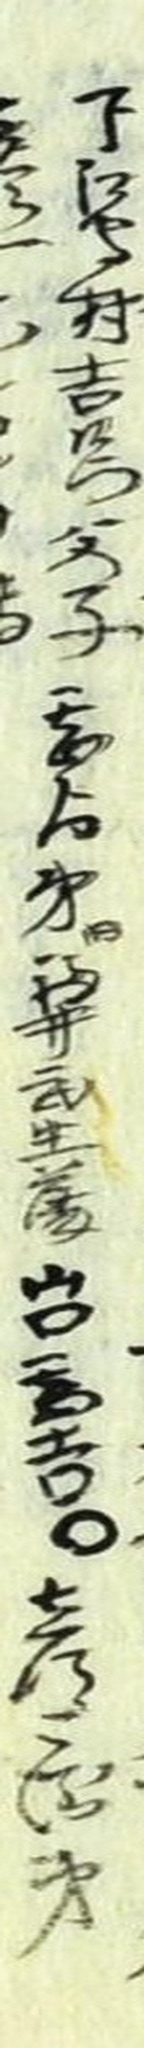下江守村吉左衛門父子甚右衛門弟旧福井武生藩山口甚吉○彦兵衛弟
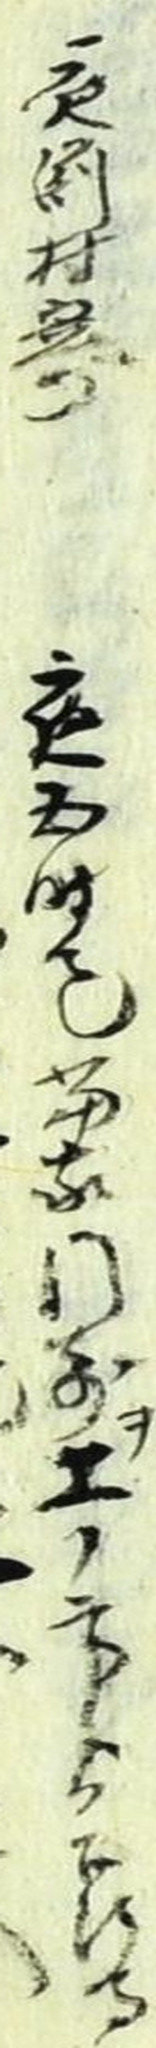夜淵村寄夜五時過当家門前ヲ上ノ方ゟ下江守
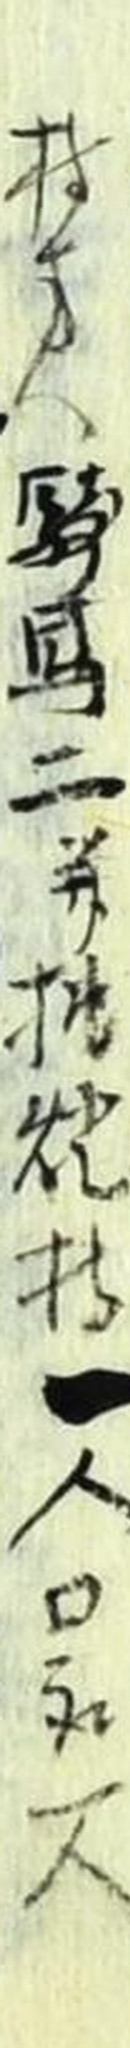村方へ騎馬二幷提灯持一人口取一人
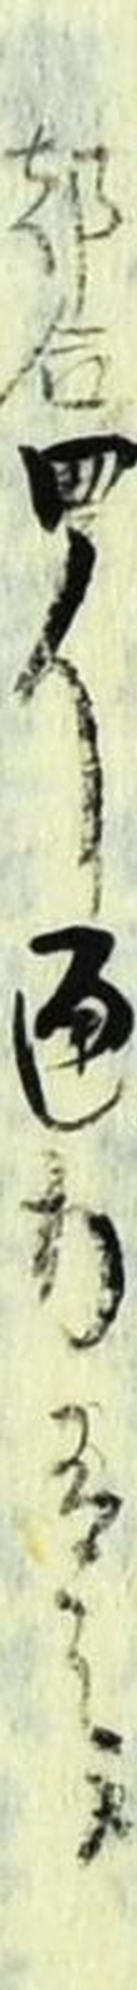都合四人通行有之候
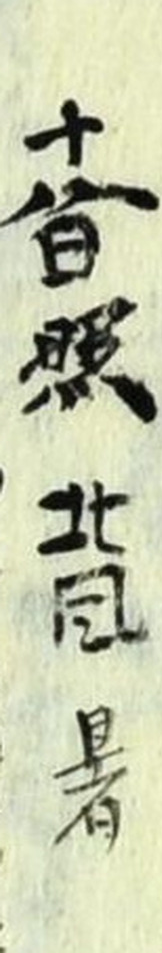十八日照北風暑中
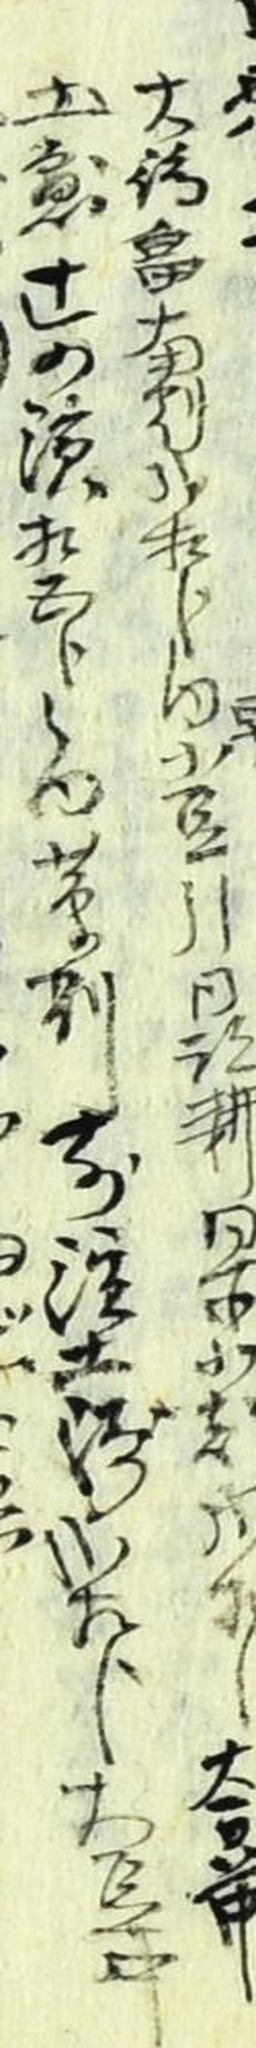土懸辻の浜拾五歩之内草割前浜土崎弐拾歩大豆中
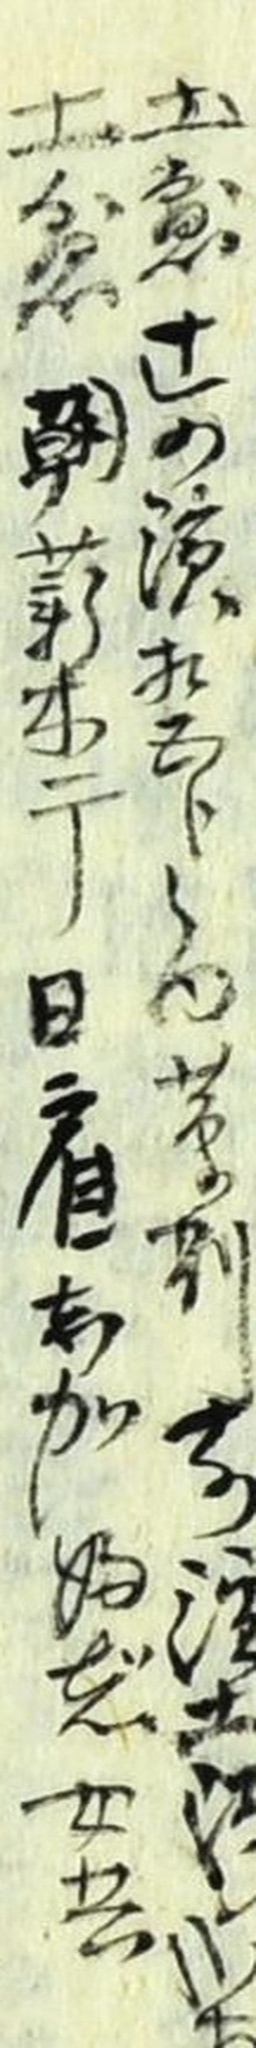土懸朝薪木干日雇しかふじ女共
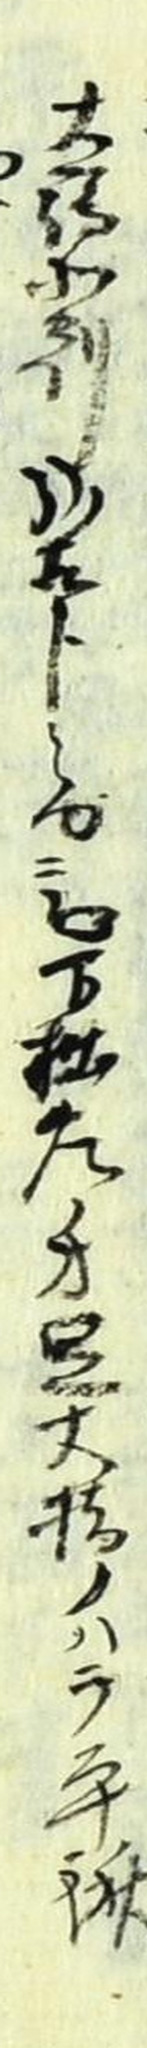大島北割弐拾歩之内ニ而下拙左ノ方足大指ノハラ平鍬
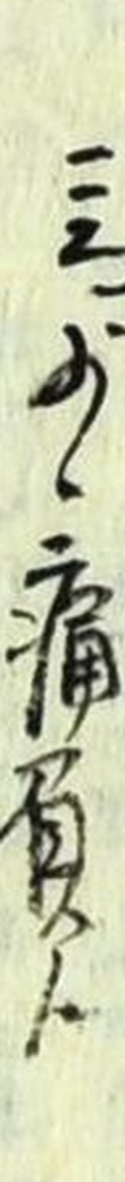ニ而少々痛負候
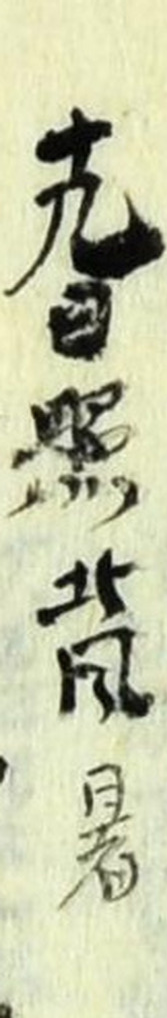十九日照北風暑
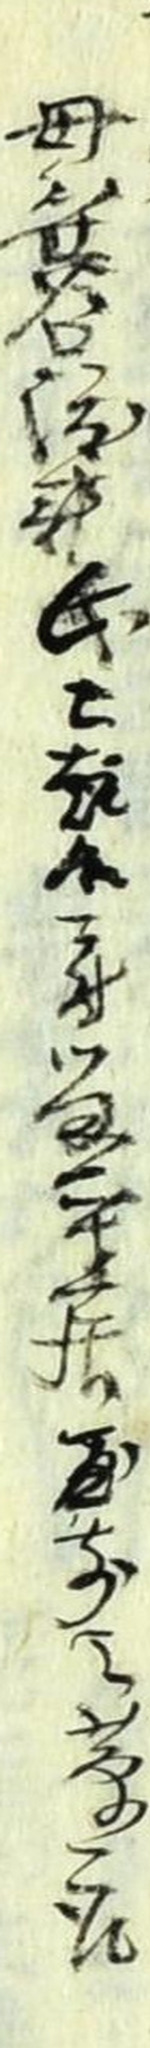母笹谷渡部氏ニ趣候ニ付留守居屋前之草取
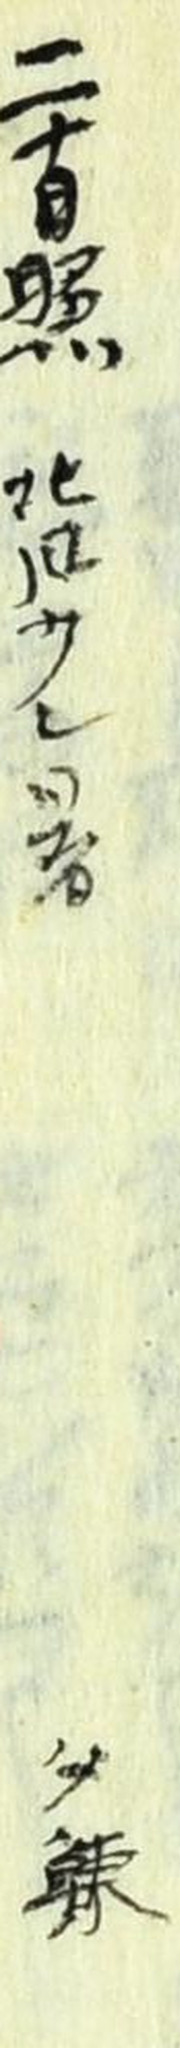二十日照北風少シ暑夕鰊
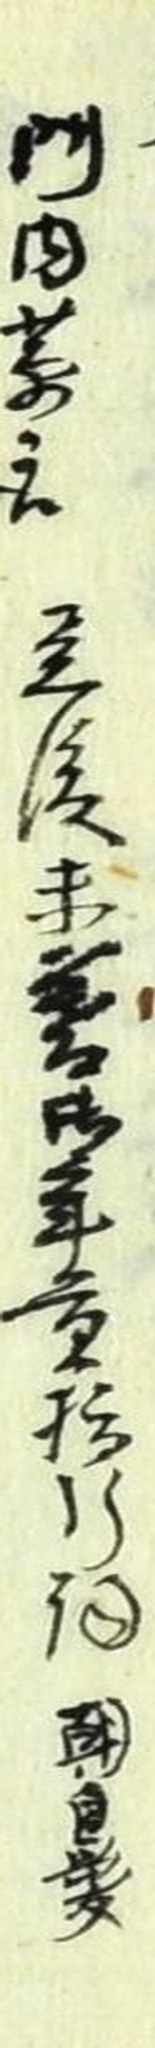門内草取昼後未暮御年貢指引調朝自髪
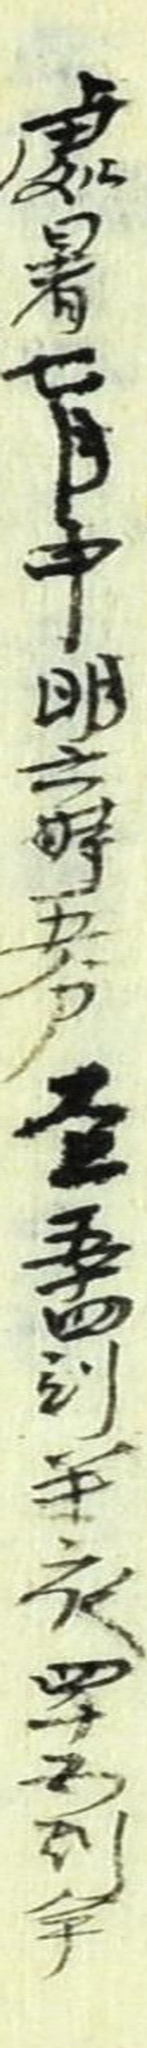処暑七月中明六時五分昼五十四刻半夜四十五刻半
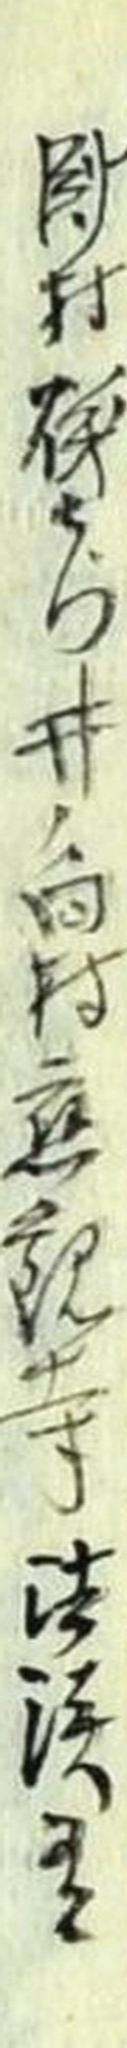淵村磯右衛門井ノ向村応観寺法談有
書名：（日記）
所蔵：福井県文書館 Fukui Prefectural Archives
